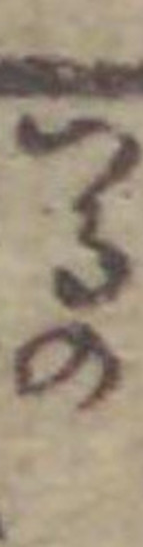つるの
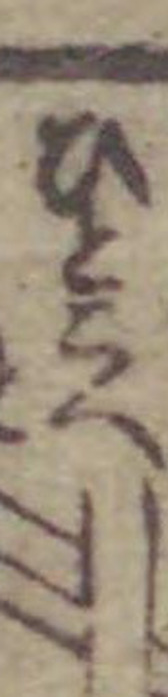ひとこへ
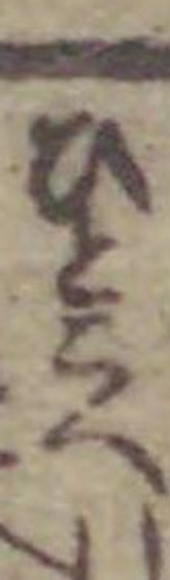ひとこへ
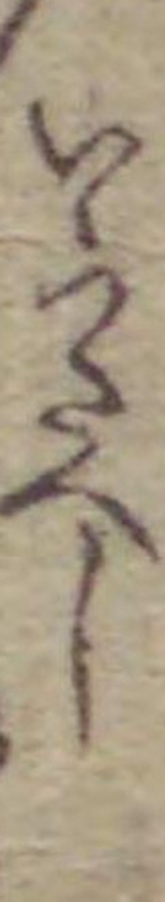いゝつたへし

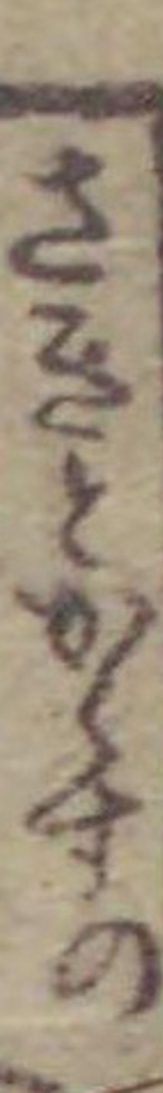さきとからすの
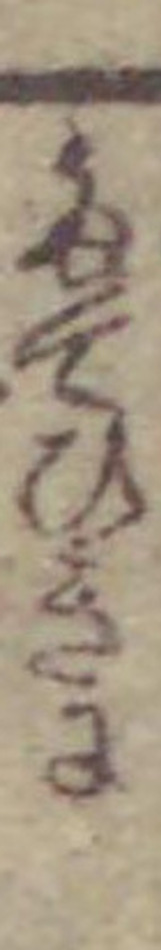たてひきに
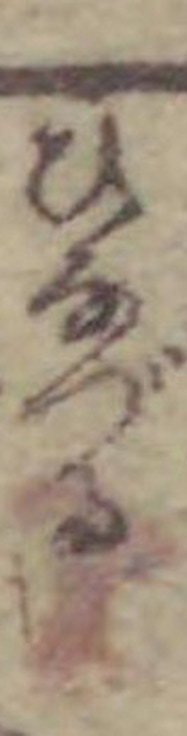ひなづる
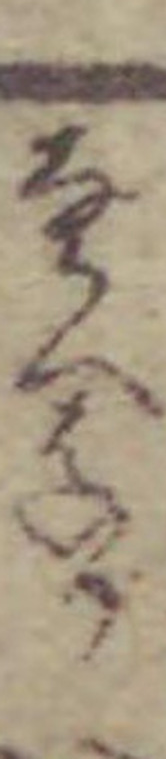なかへはいり
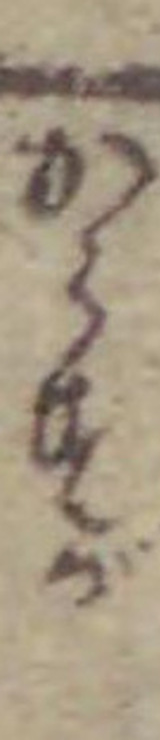からすが
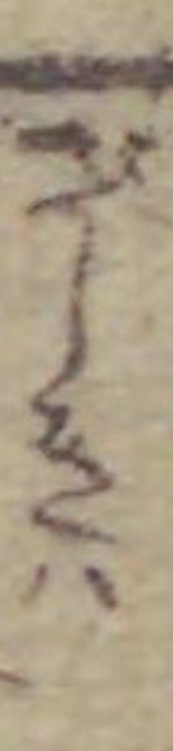ざしきハ
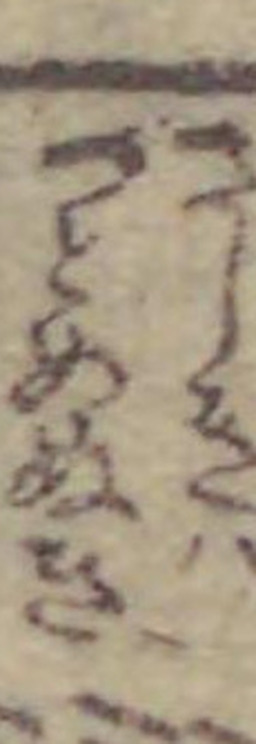つとめぬき
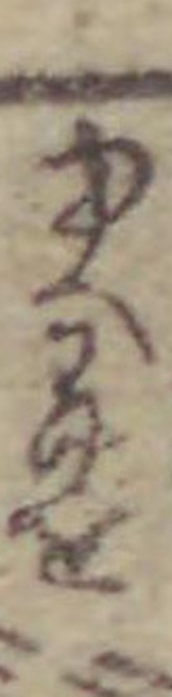ゆへわけを
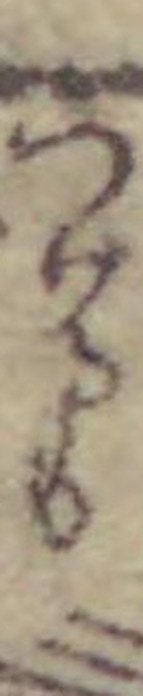つけるも
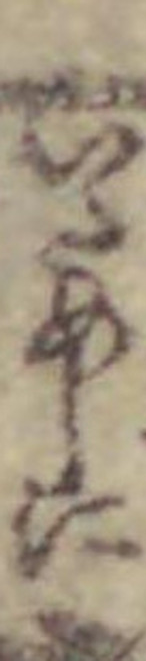いためしに
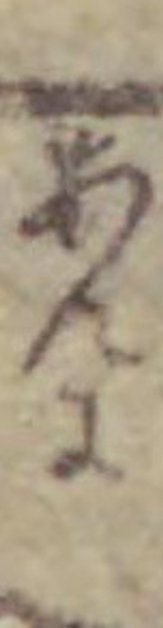あんに
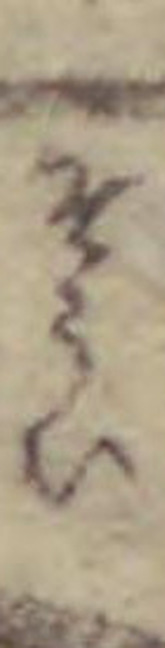そうい
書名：烏行水諺草 3巻
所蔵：国立国会図書館 National Diet Library, JAPAN
